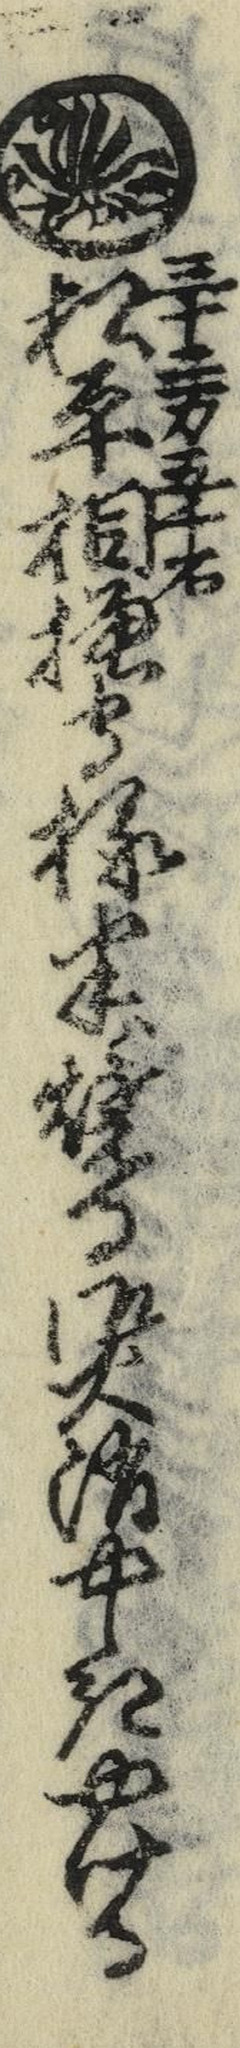松平相模守様半焼る御火消やしきやける
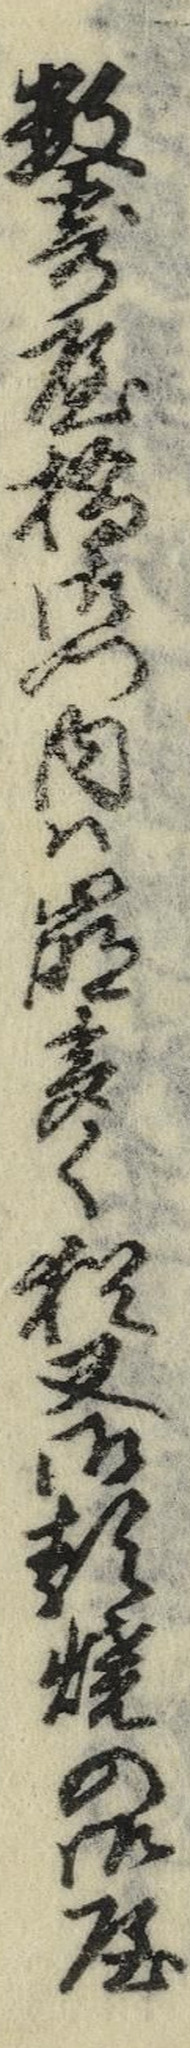数寄屋橋御門内は崩多く猶又御類焼の御屋
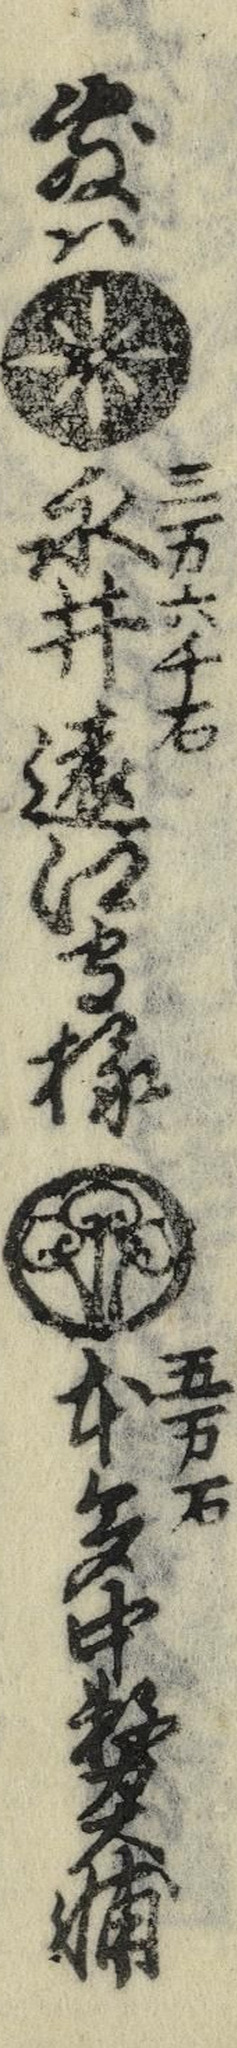敷は永井遠江守様本多中勢大輔
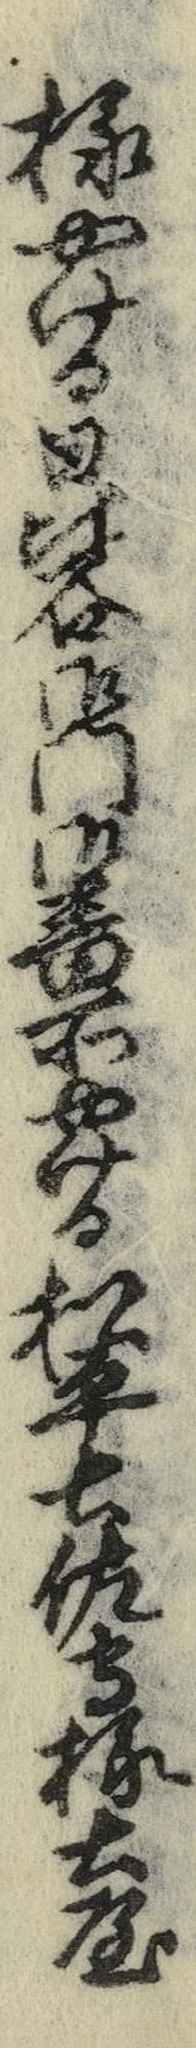様やける日比谷御門御番所やける松平土佐守様土屋
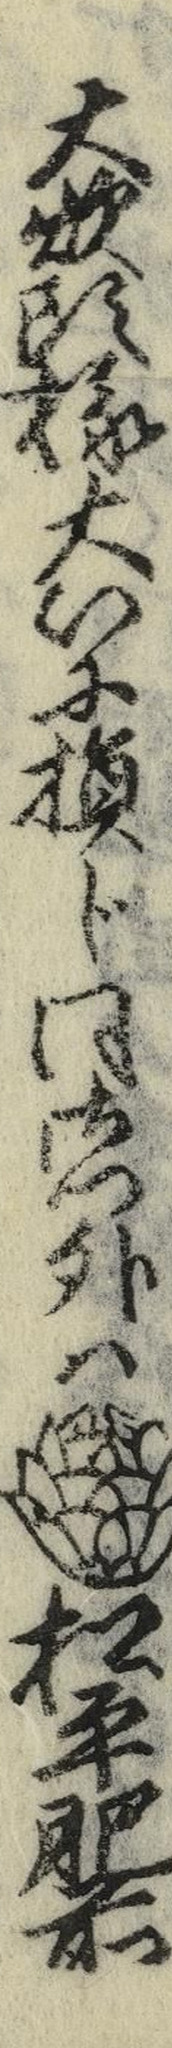大炊頭様大いに損じ同御門外は松平肥前
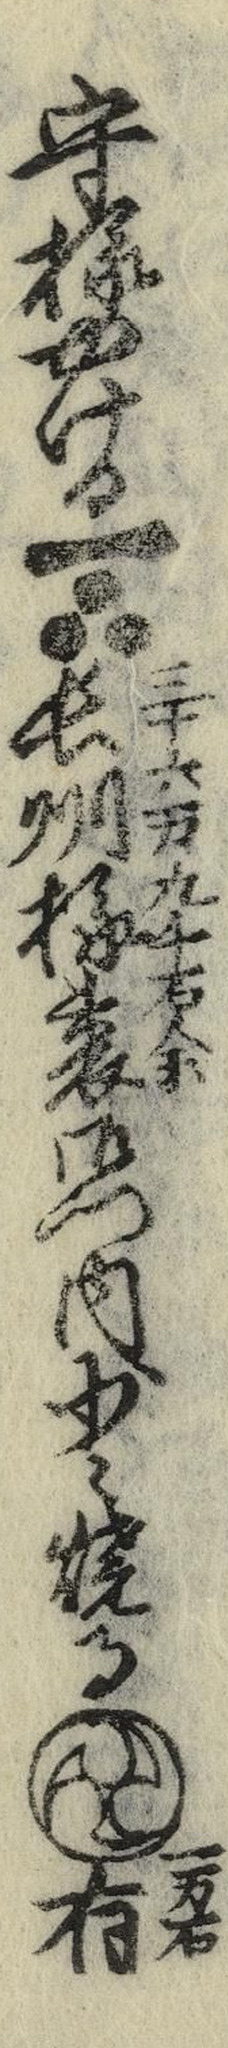守様やける長州様表御門内少々焼る有
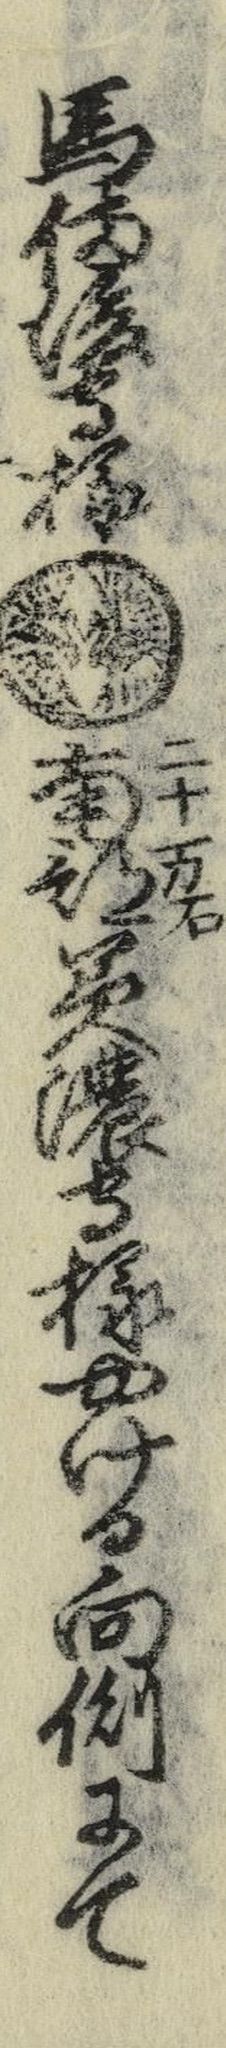馬備後守様南部美濃守様やける向側にて
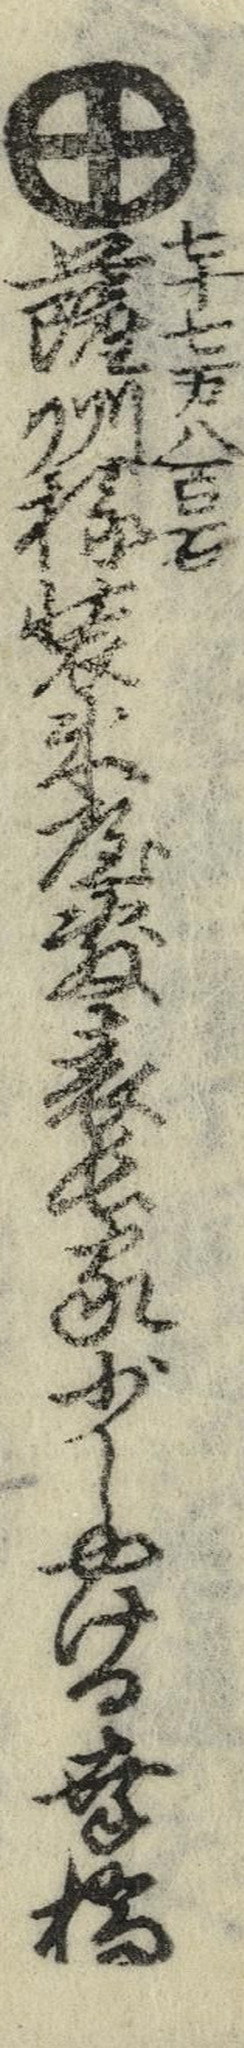薩州様装束屋敷表長家少しやける幸橋
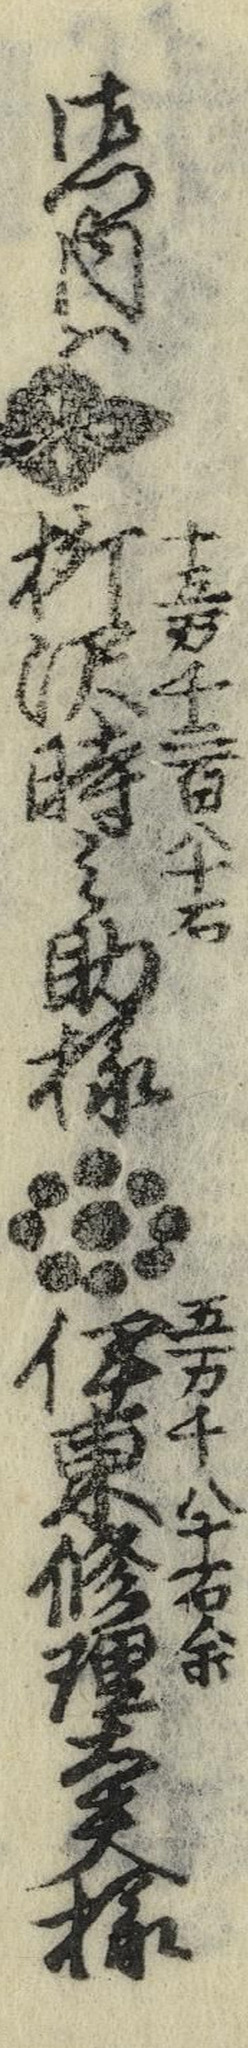御門内は柳沢時之助様伊東修理大夫様
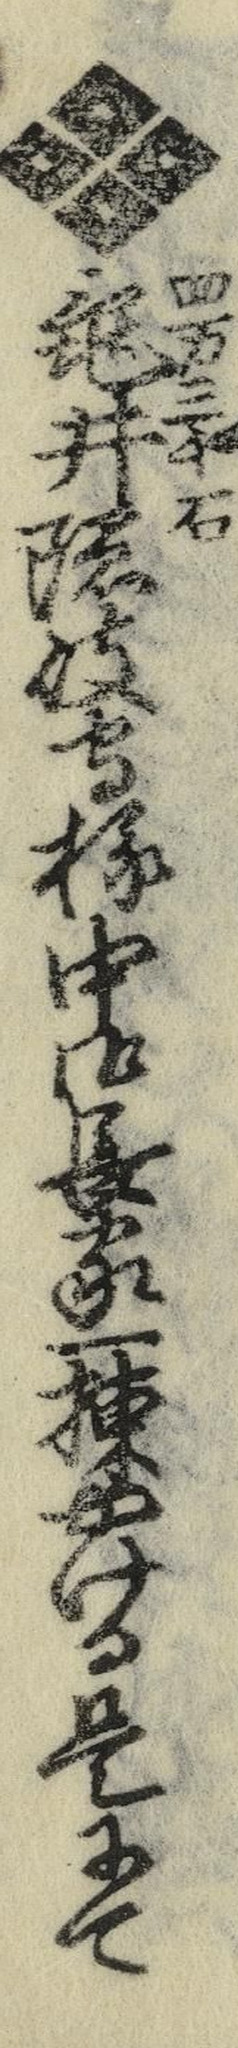亀井隠岐守様中御長家一棟やける是にて
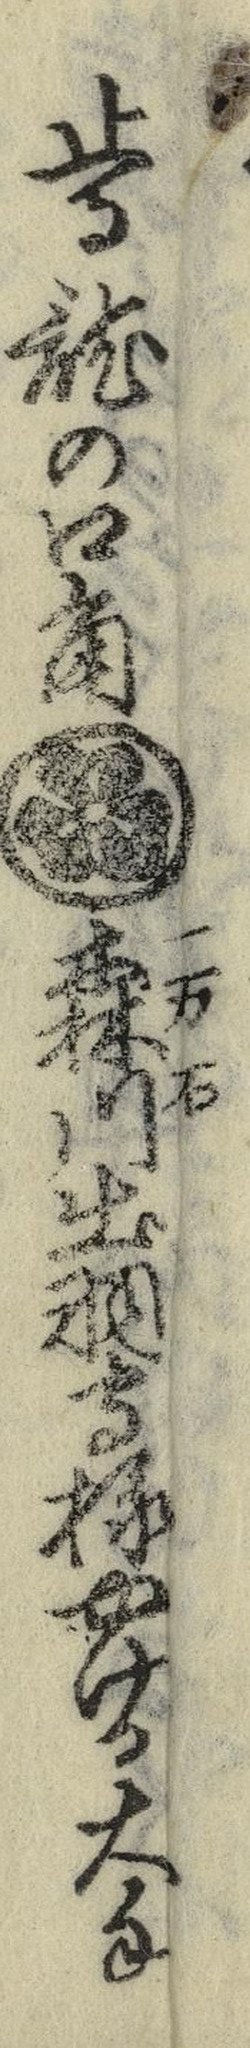止る龍の口角森川出羽守様やける大手
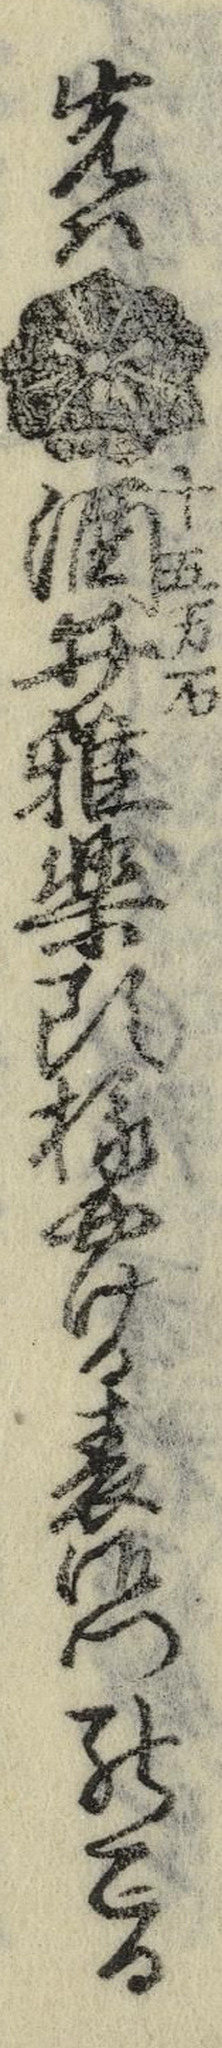先は酒井雅楽頭様やける表御門のこる
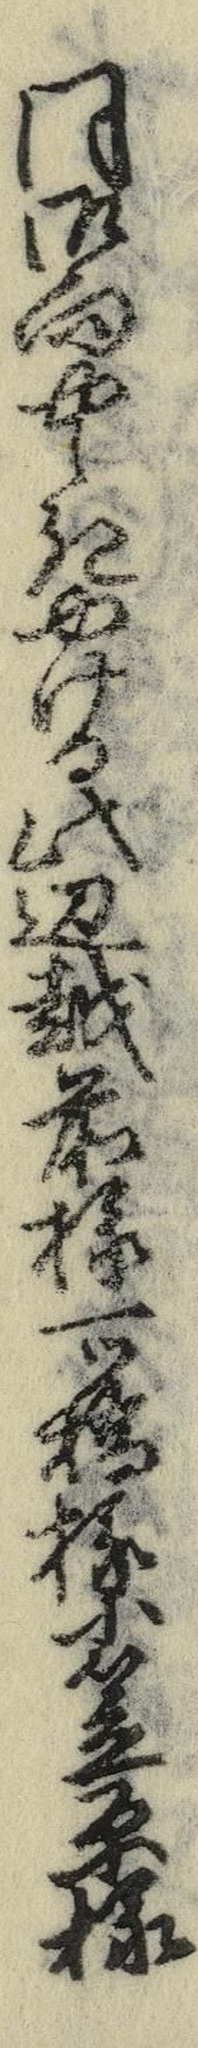同御向やしきやける此辺越前様一ツ橋様小笠原様
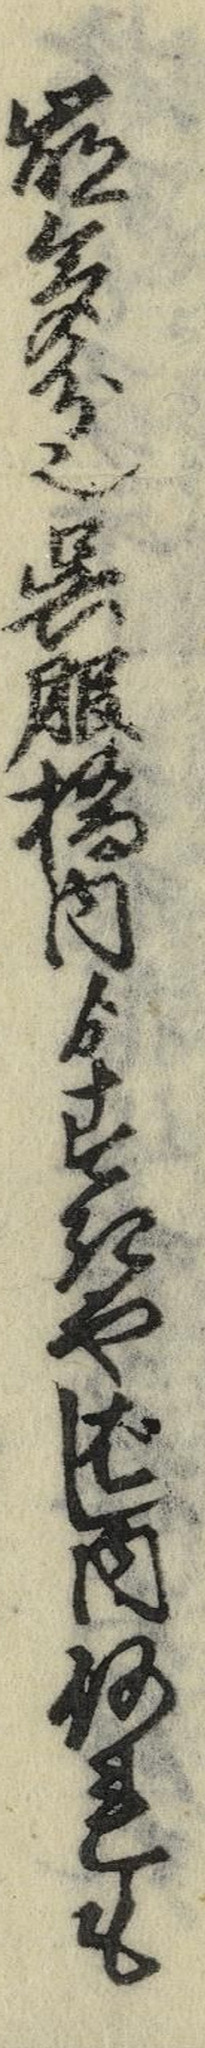崩多分也呉服橋内ゟすきやばし内何れも
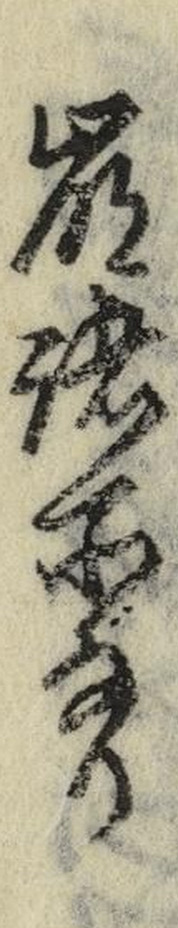崩諸所なり
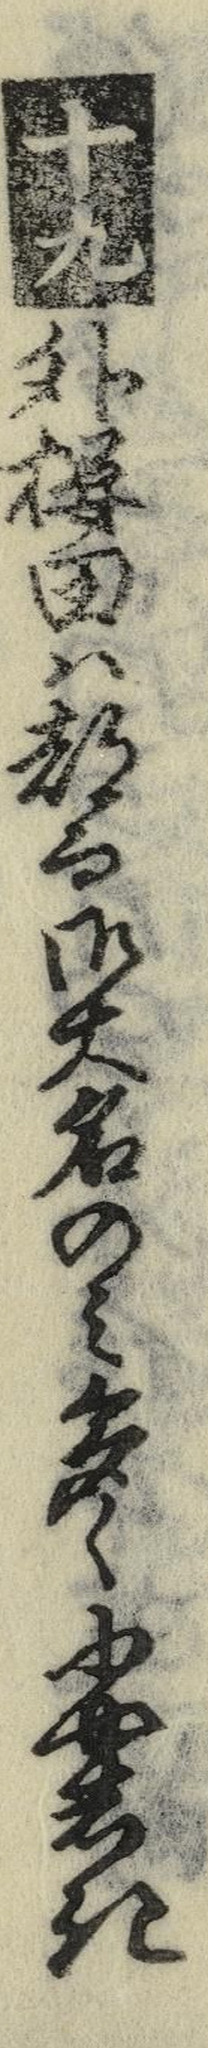十九外桜田は都而御大名のみ多く小やしき
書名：地震類焼場所明細書之写　安政二卯年十月二日夜四ツ時過　御府内御屋敷方市中共、并街道筋近郷聞書
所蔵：東京大学地震研究所図書室 Earthquake Research Institute Library, The University of Tokyo, JAPAN
